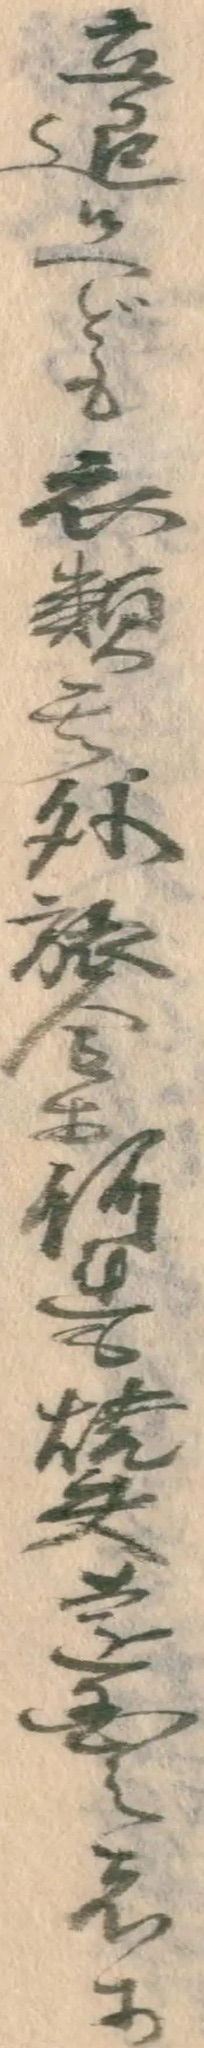立退候へども衣類其外旅金等何れも焼失遠国之者
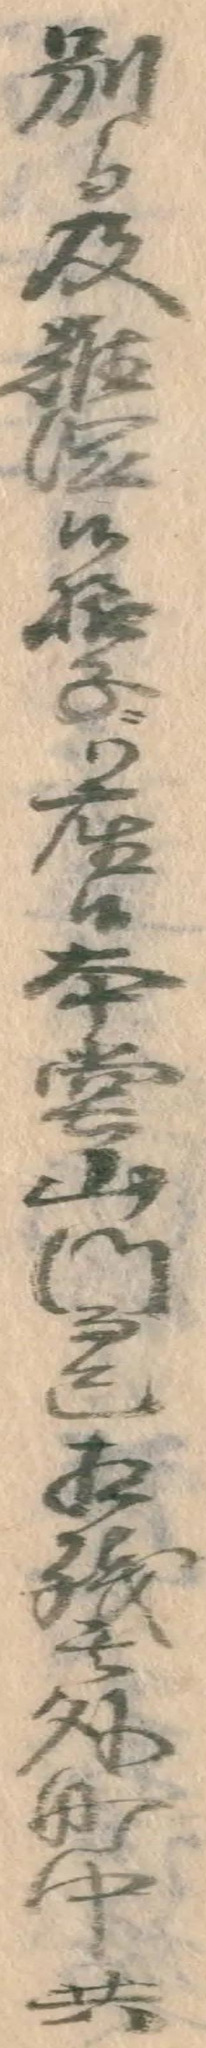別而及難渋ニ及候様子ニ御座候本堂山門而已相残其外町中共
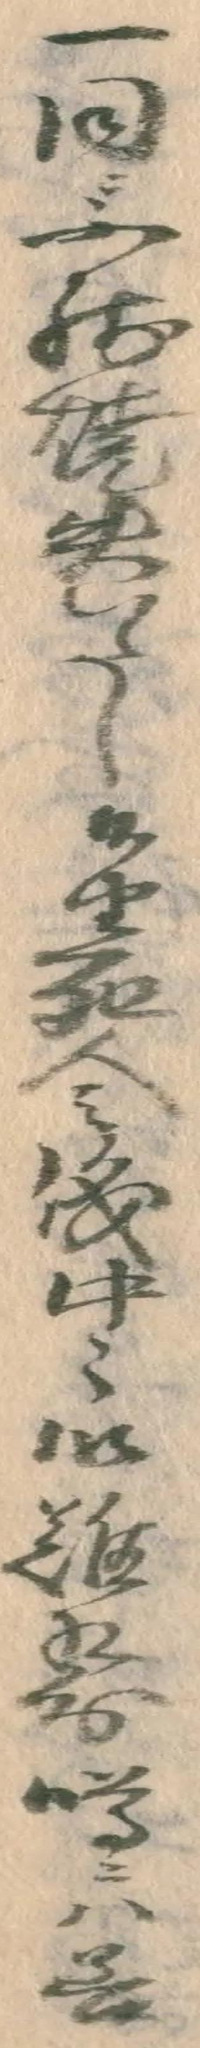一同無残焼失いたし候由死人之義中々以難相分噂ニハ善
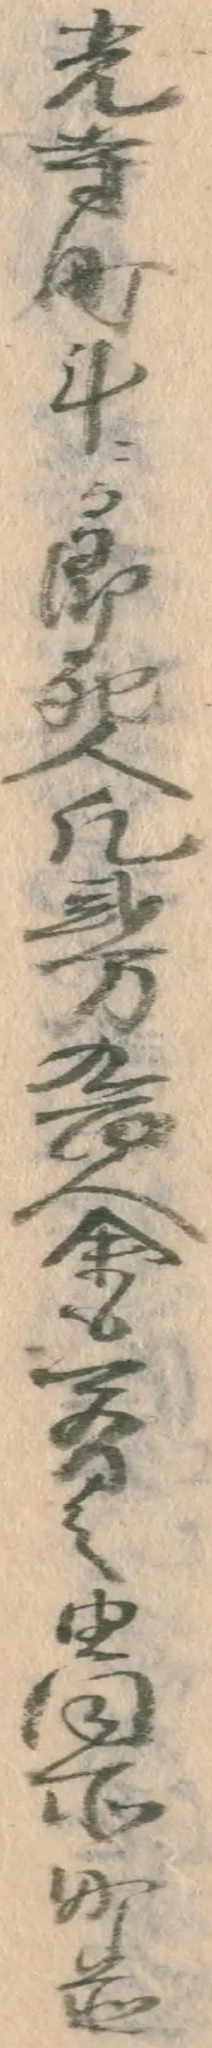光寺町計ニ而即死人凡弐万九百人余も有之由同所町置
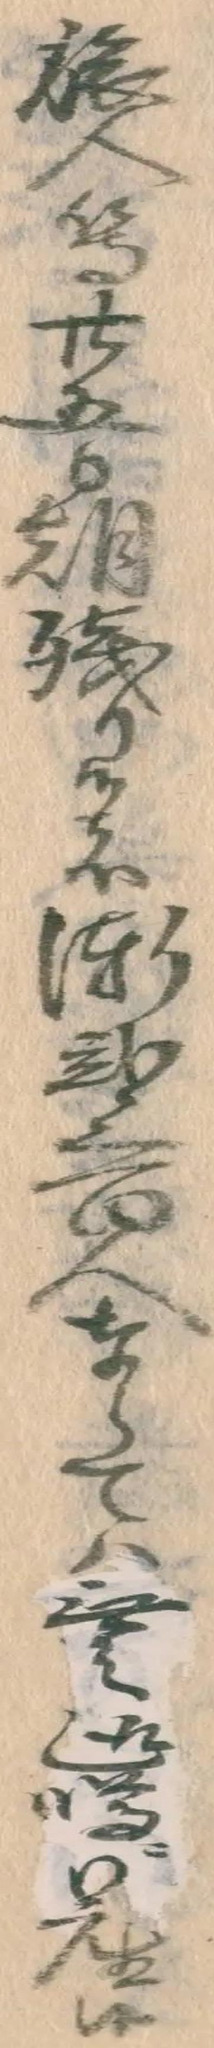旅人等廿五日朝残り候者漸弐三百人ならてハ無之趣噂二御座候
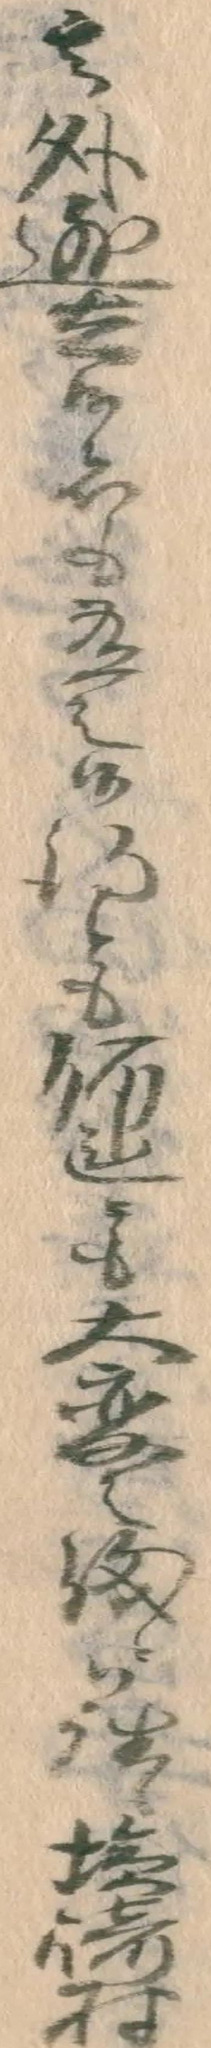其外逃去候者も有之候得とも何れ二も大変之儀ニ御座候塩崎村
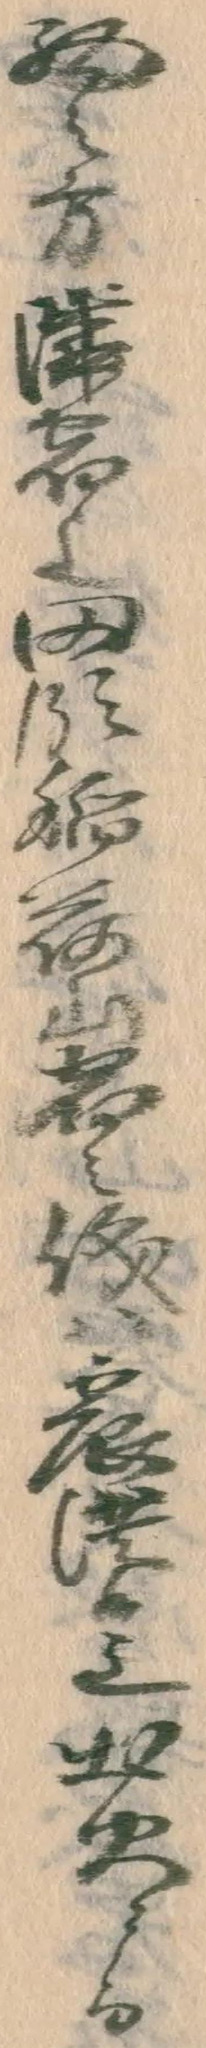西之方隣宿上田領稲荷山宿之儀ハ震潰候上出火ニ而
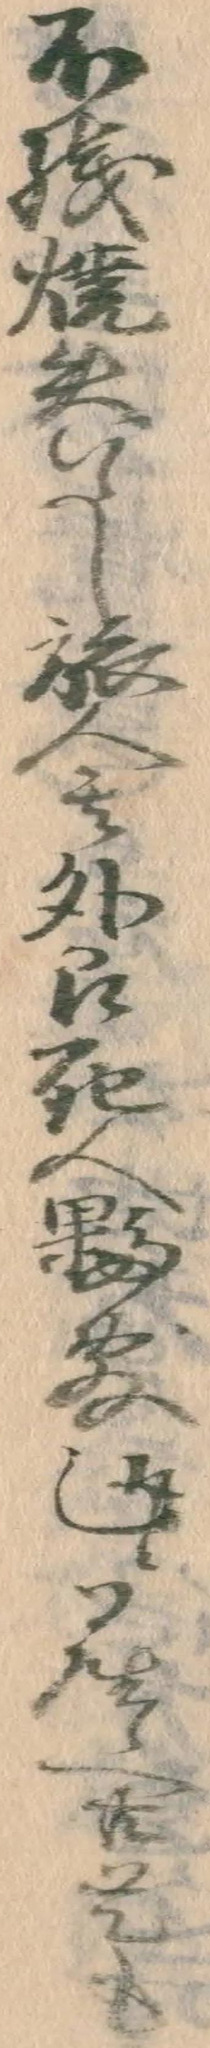不残焼失いたし旅人其外即死人夥敷趣ニ御座候へ共是も
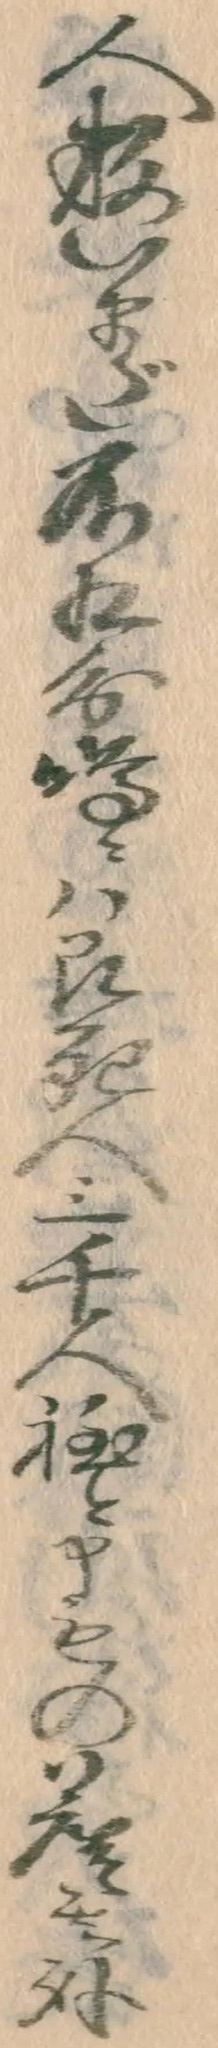人数いまだ不相分噂ニハ即死人三千人程と申もの御座候其外
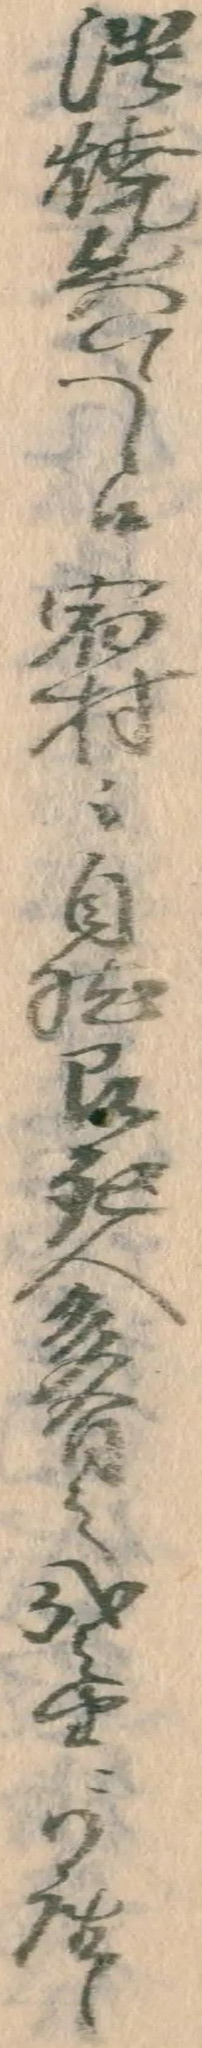潰焼失いたし候宿村々自然即死人多有之哉之由二御座候
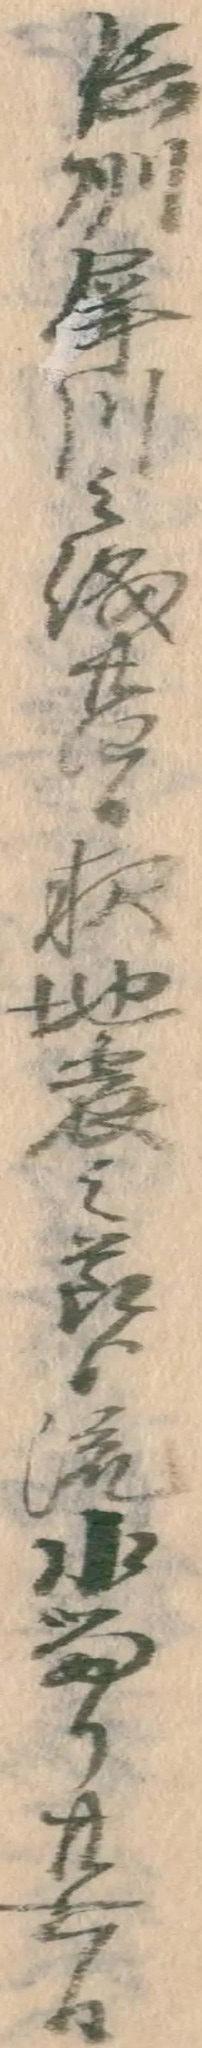信州犀川之儀廿四日夜地震之節ゟ流水留り廿六日
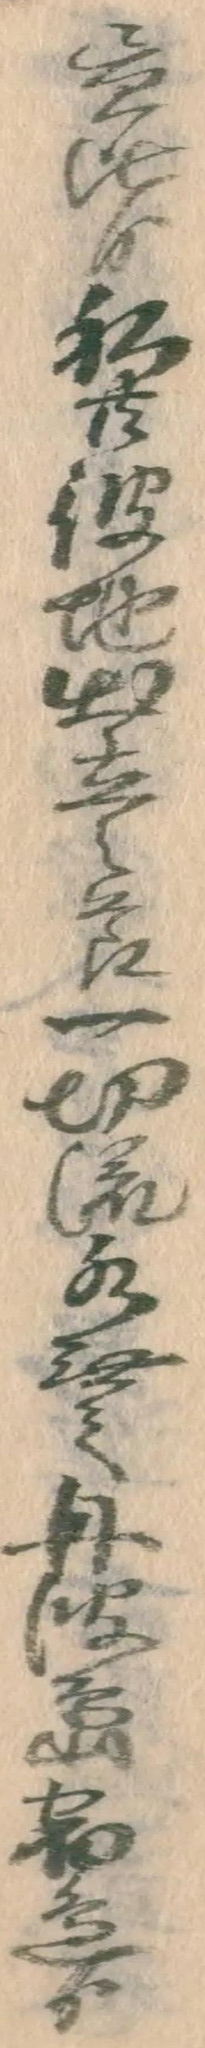昼比ゟ私共彼地出立之節一切流水無之丹波島宿辺ゟ
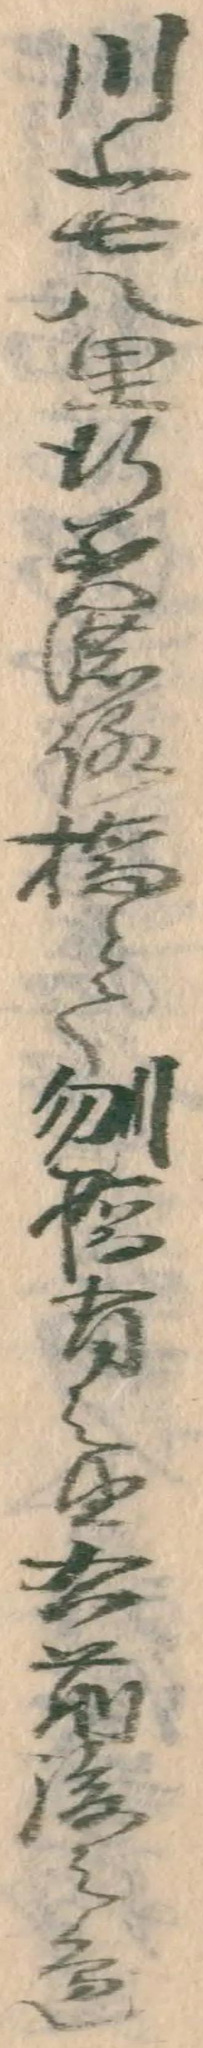川上七八里行美濃路橋にて刎橋有之由右前後之辺
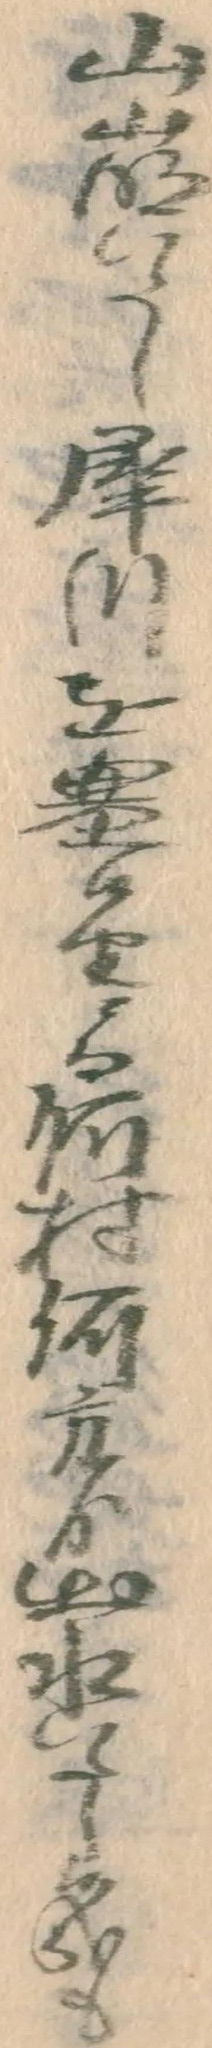山崩いたし犀川を塞候由ニ而何村何方ゟ出水いたし候哉も
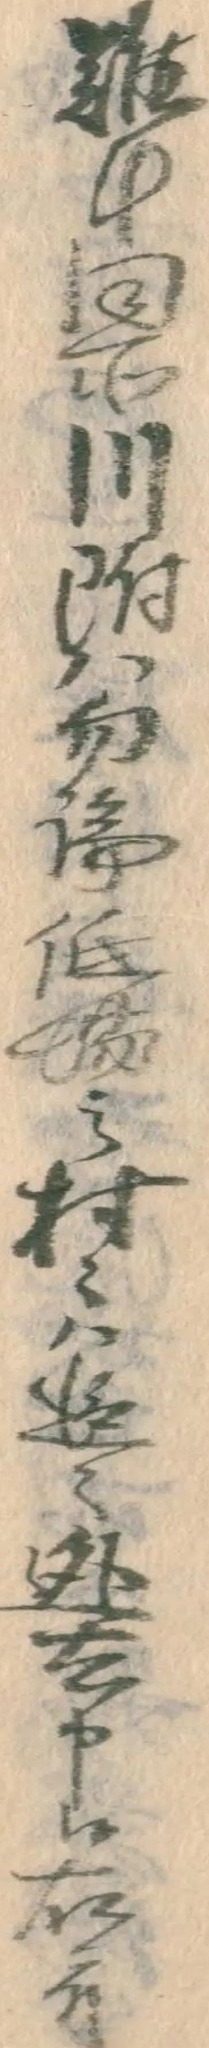難計同所川附ハ勿論低場之村々ハ追々逃去申候右ニ付
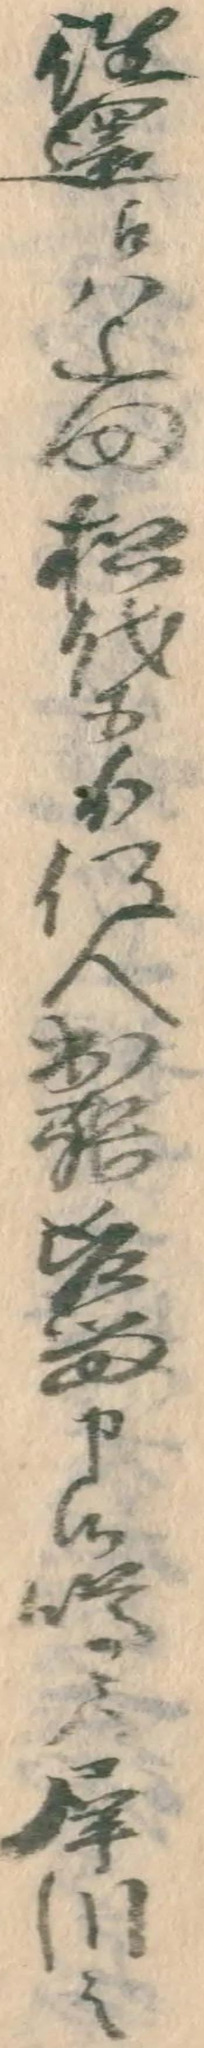往還江ハ上田松代等江役人出張差留申候噂ニハ犀川之
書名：信州大地震之記
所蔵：国立国会図書館 National Diet Library, JAPAN
